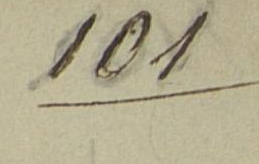101
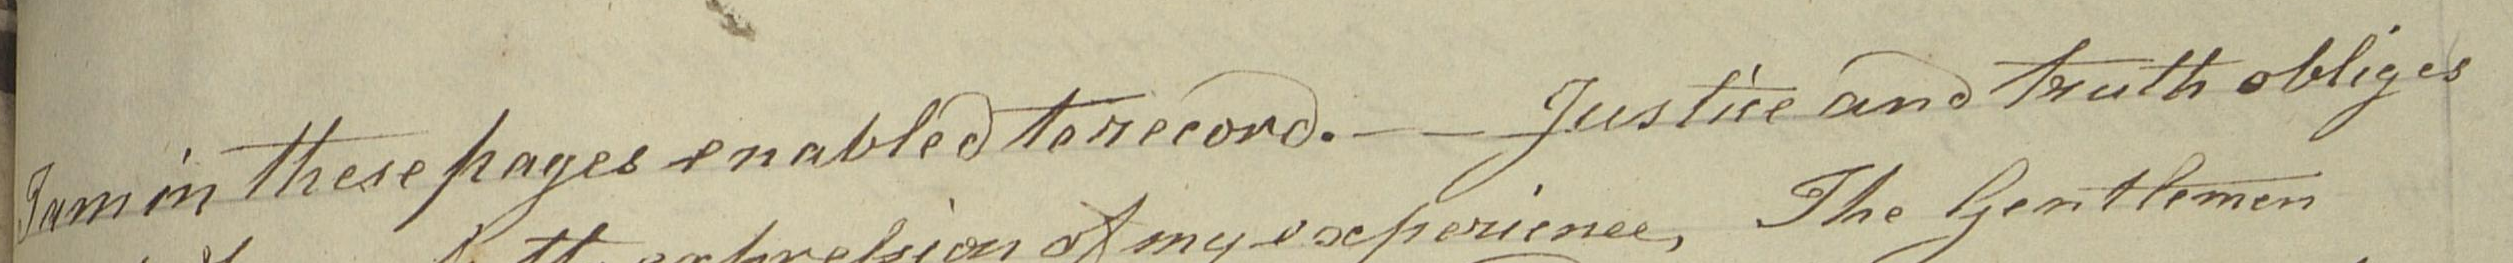I am in these pages enabled to record. Justice and truth obliges
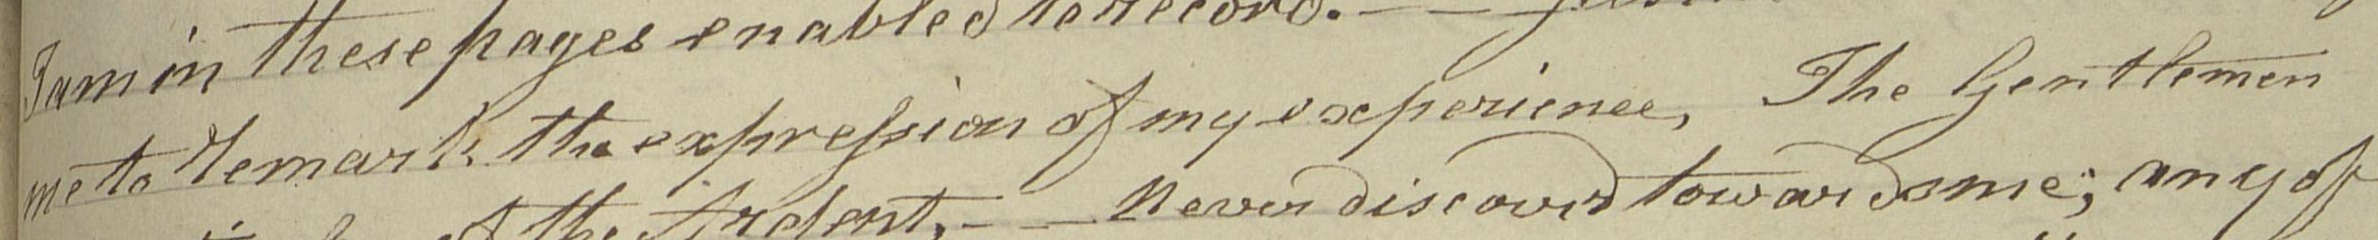me to remark the expression of my experince. The Gentlemen
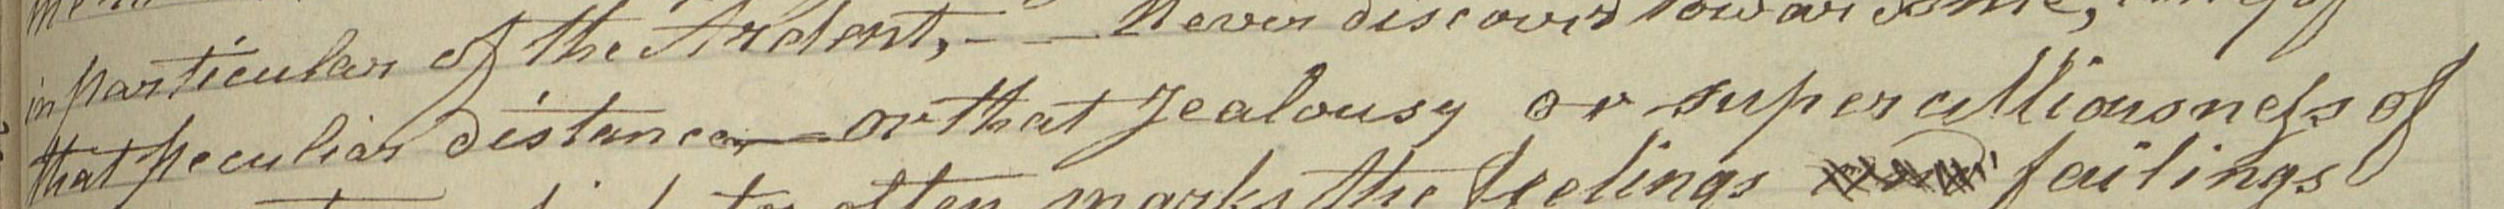that peculiar distance or that jealousy or supercilliousness of
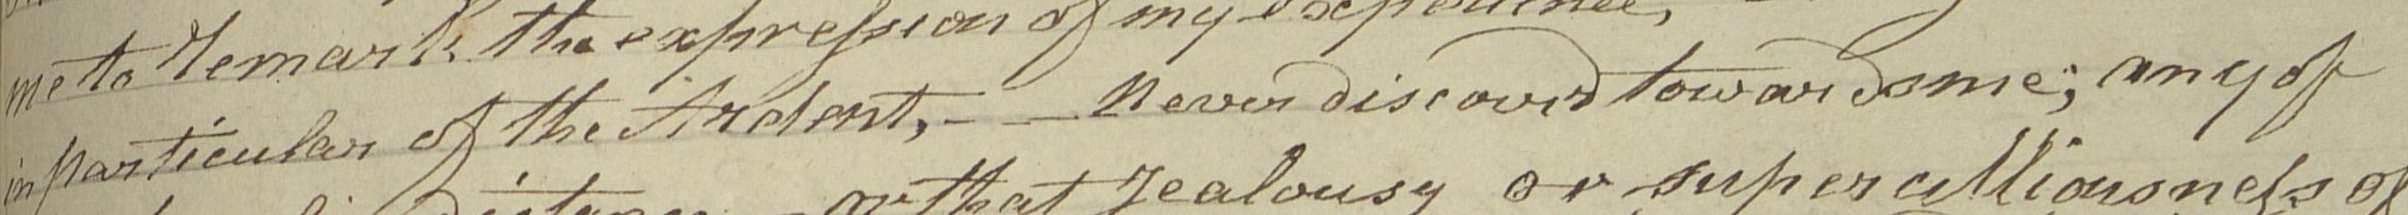particular of the Ardent, Never discovrd toward once; any of
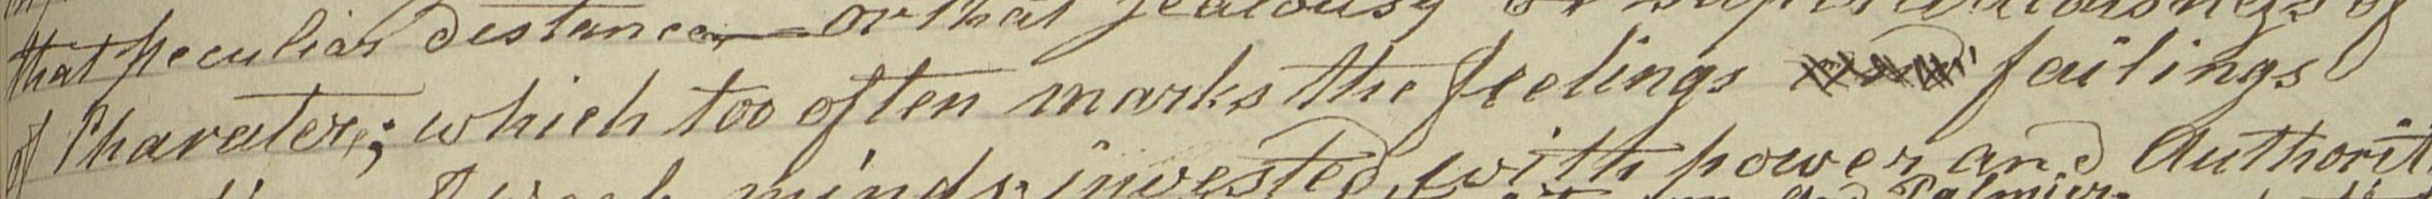of Character; which too often marks the feelings [and] failings
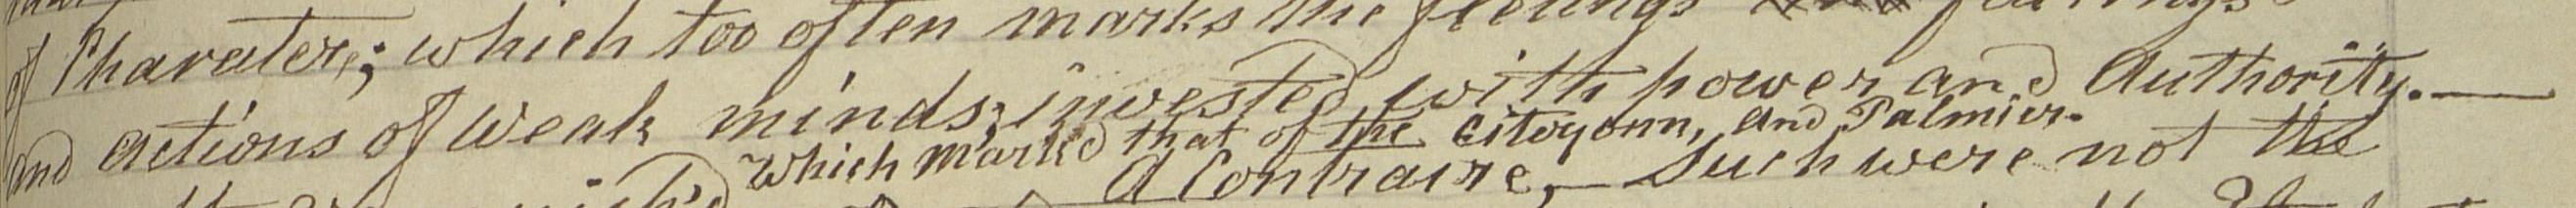and actions of weak minds, invested with power and Authority.
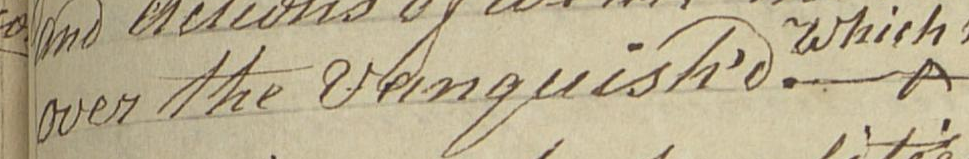over the vanquish'd. ^
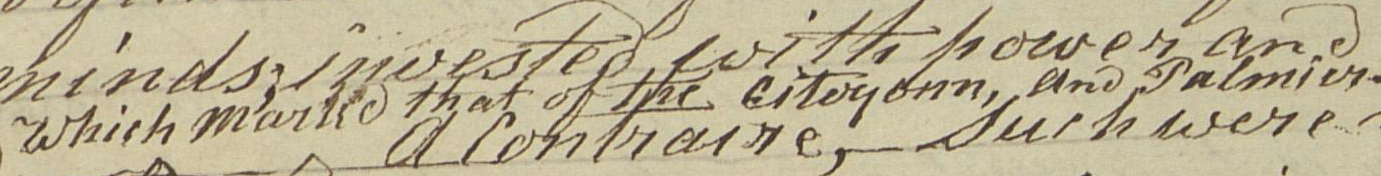which mark'd that of the Citoyonn and Palmier.
